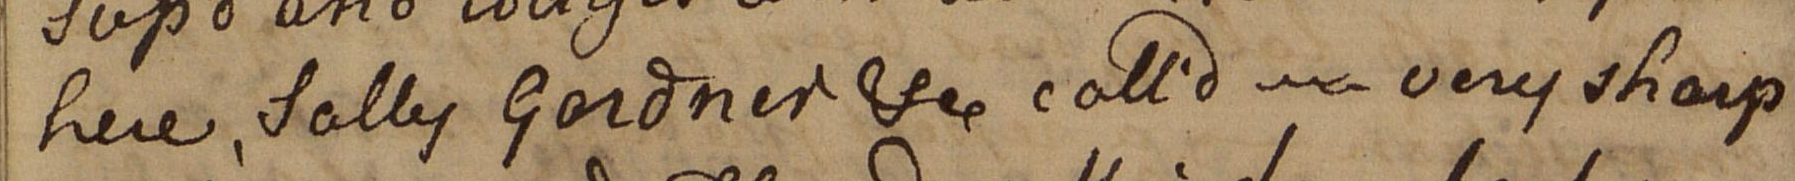here, Sally Gordner &c call'd- very sharp
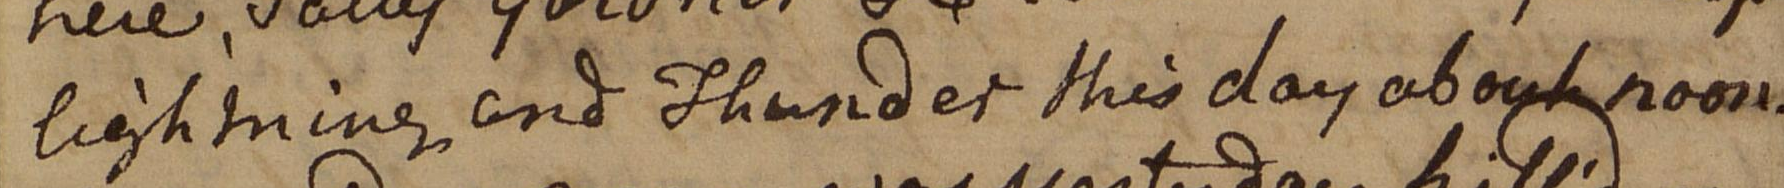lightning and Thunder this day about noon.
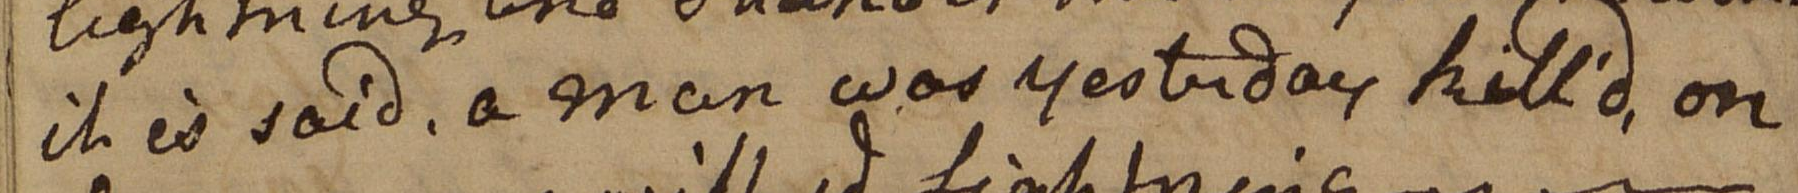it is said. a man was yesterday kill'd, on
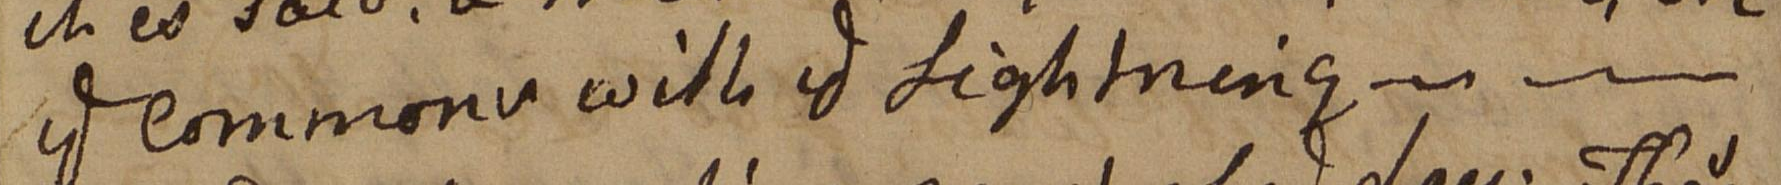y^e commons with y^e Lightning-
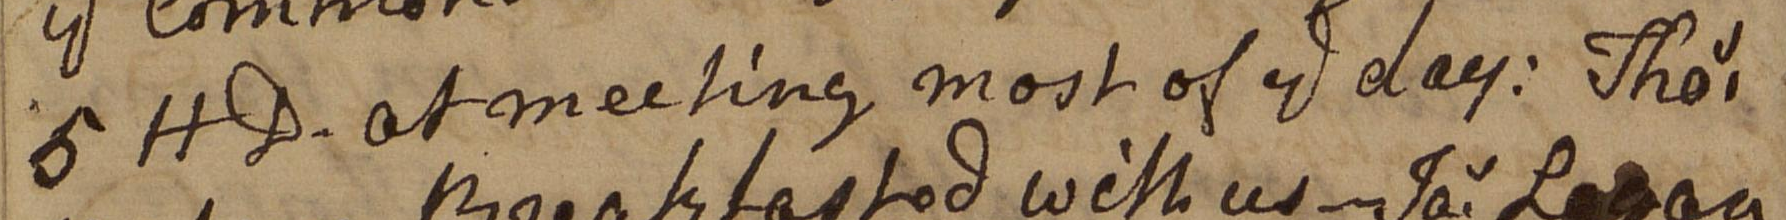5 HD. at meeting most of y^e day: Tho.^s
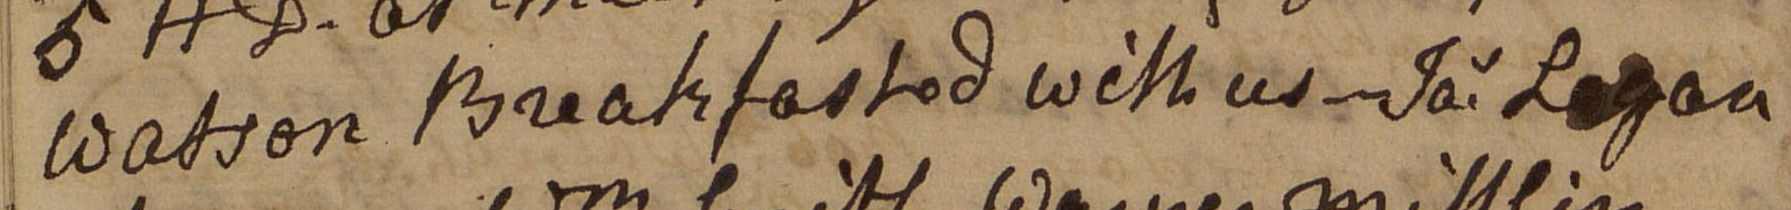Watson Breakfasted with us- Ja.^s Logan
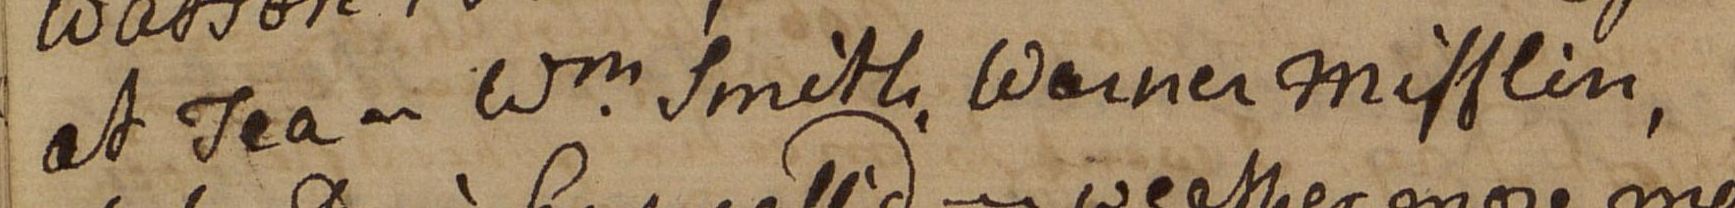at Tea- W^m. Smith, Warner Mifflin,
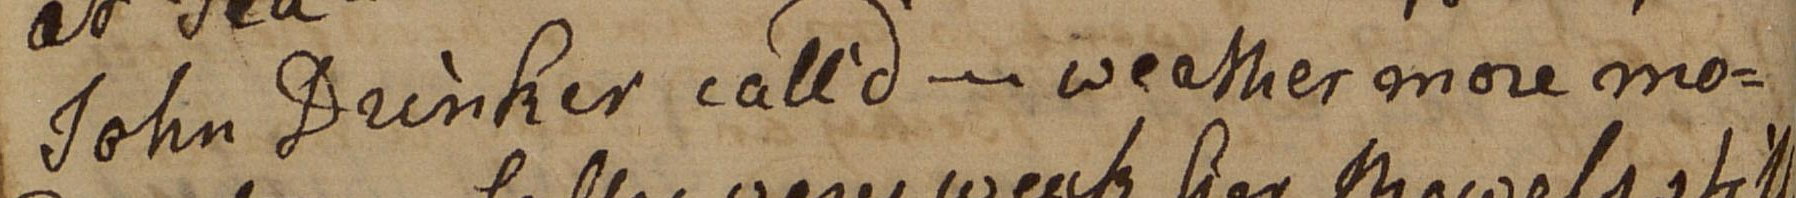John Drinker call'd- weather more mo-
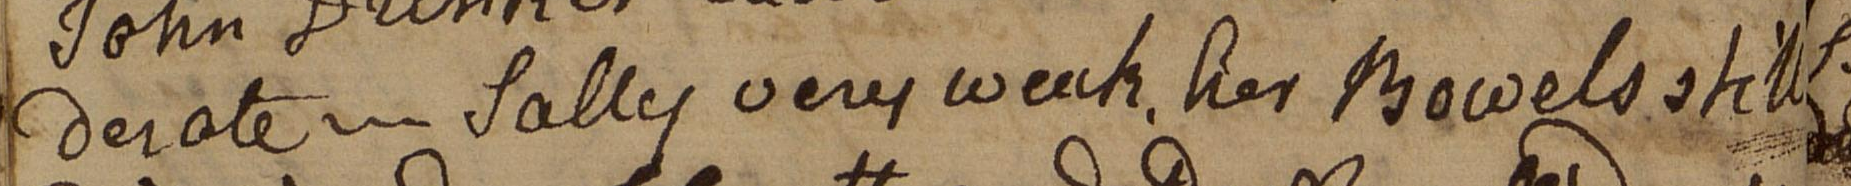derate- Sally very weak, her Bowels still
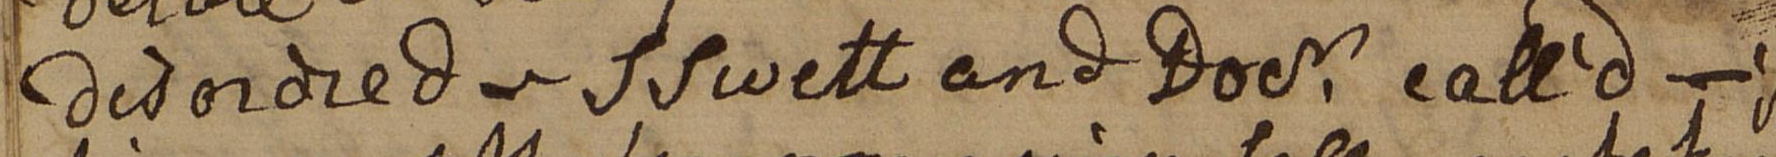didorored- S Swett and Doc^r. call'd-
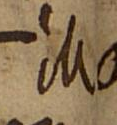'M
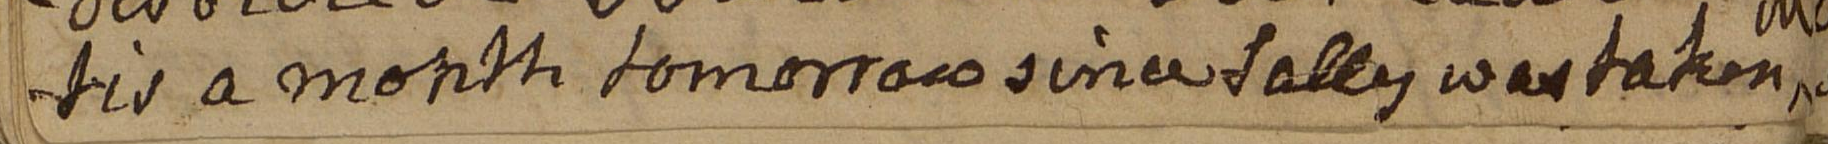tis a month tomorrow since Sally was taken,
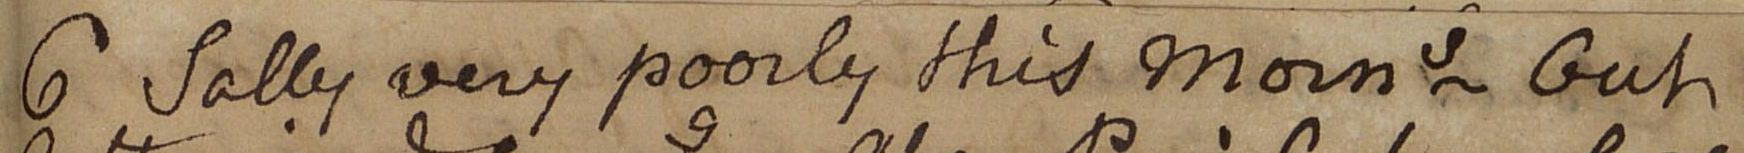6 Sally very poorly this Morn^g- but
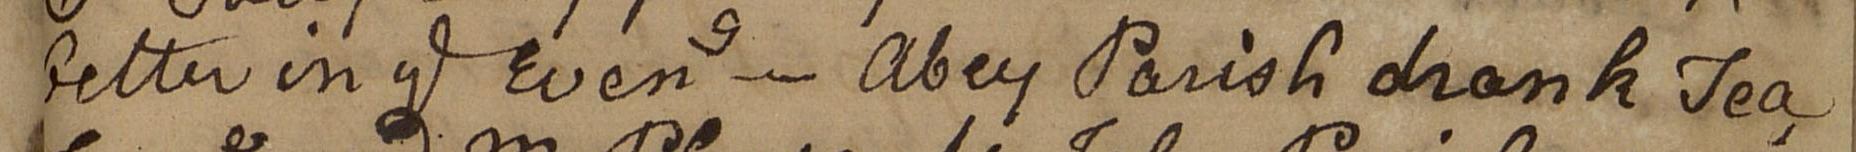detter in y^e Even^g- Abey Parish drank Tea,
